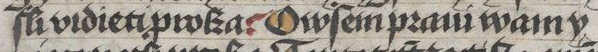ẛli vidieti ꝓroka?Owẛem praui wam y
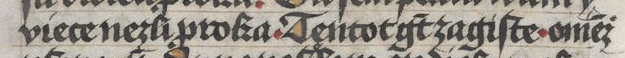víece neżli ꝓroka.Tento ḡt zagiſte.oniēż
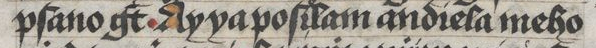pſano ḡt.Ay ya poſilam andiela meho¬
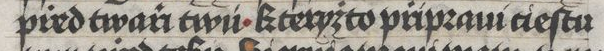pṙed twaṙi twú.kteryżto pṙipraui cieſtu
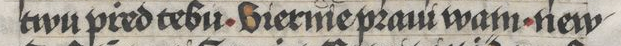twu pṙed tebu.Viernie praui wam.new¬
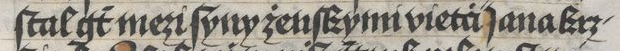ſtal ḡt mezi ſyny żenſkymi vietċí Iana krz¬
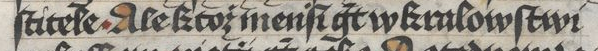ſtitele.Ale ktoż menẛí ḡt wkralowſtwí
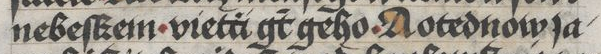nebeſkem.vietčí ḡt geho.A otednow Ia¬
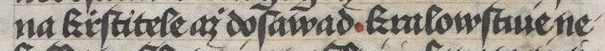na kṙſtitele aż doſawad.kralowſtuíe ne¬
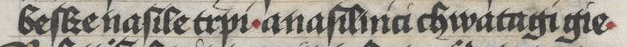beſke naſile trpí.a naſilníci chwatagí gie.
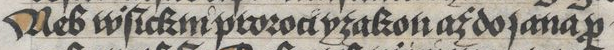Neb wẛlckni proroci y zakon aż do Jana ꝓ¬
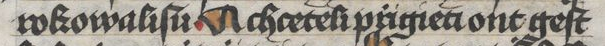rokowali ſu.A chceteli pṙigieti ont geſt
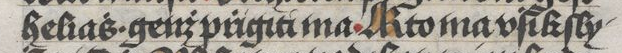heliaṡ.genż pṙigiti ma.Kto ma vẛik ſly¬
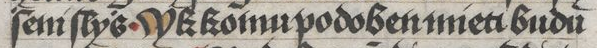ẛení ſlyṡ.Y komu podoben míeti budu
